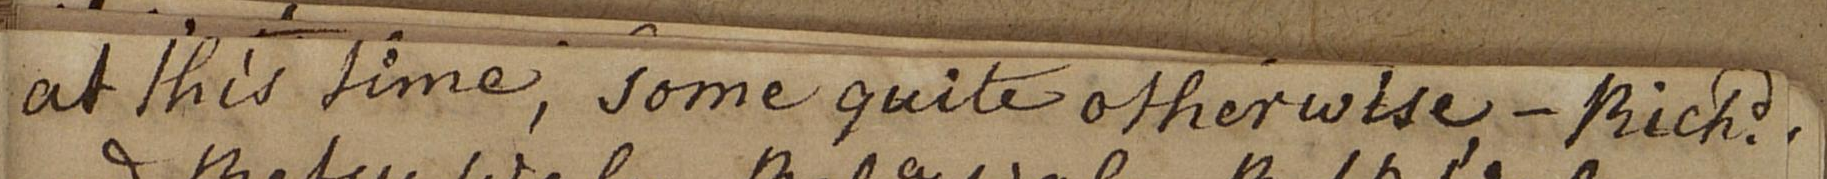at this time, some quite otherwise- Rich^d.
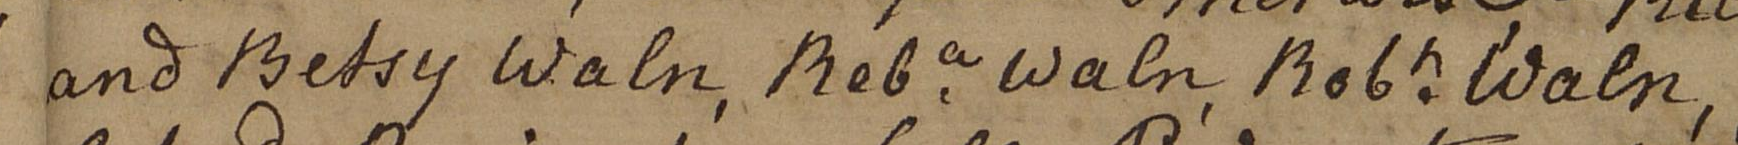and Betsy Waln, Reb^a. Waln, Rob^t. Waln,
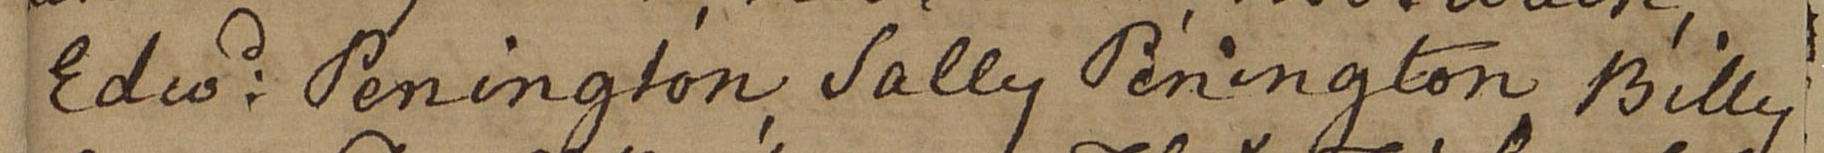Edw^d: Penington, Sally Penington, Billy
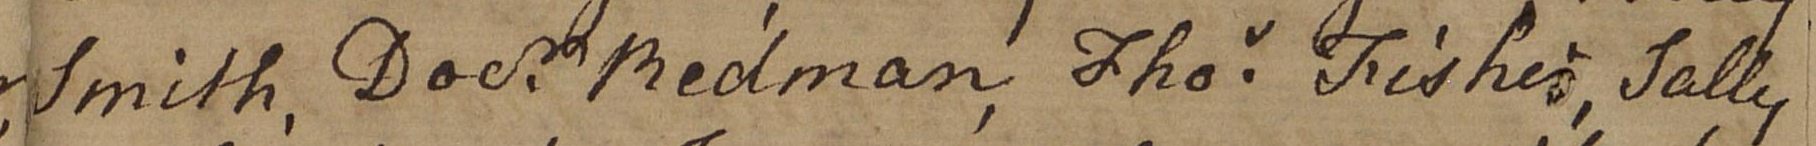Smith, Doc^r. Redman, Tho^s. Fisher, Sally
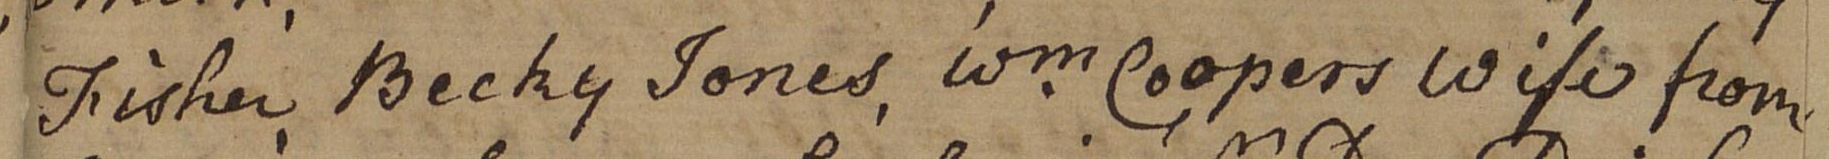Fisher, Becky Jones, W^m. Coopers Wife from
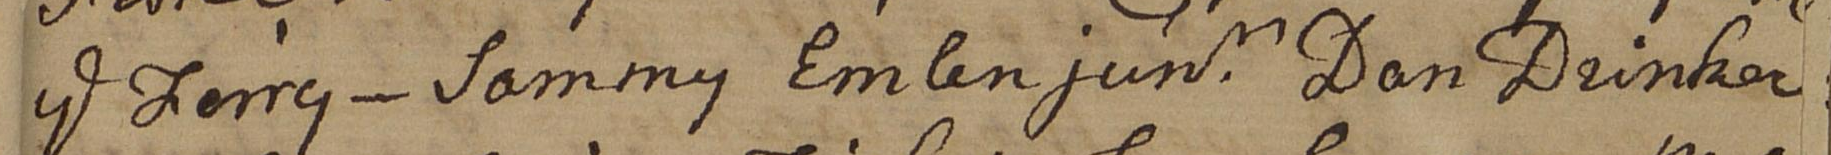y^e Ferry- Sammy Emlen jun^r. Dan Drinker
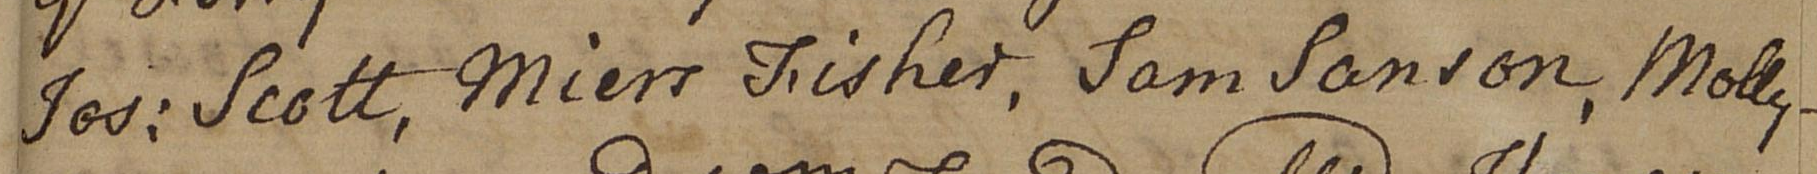Jos: Scott, Miers Fisher, Sam Sanson, Molly
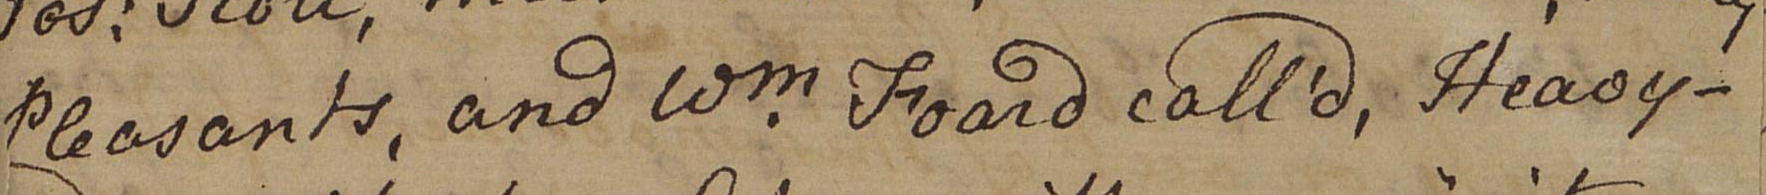Pleasants, and W^m. Foard call'd, Heavy-
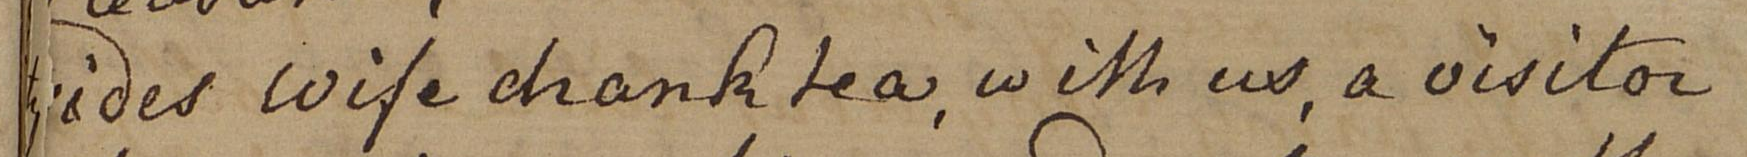ides Wife drank tea, with us, a visitor
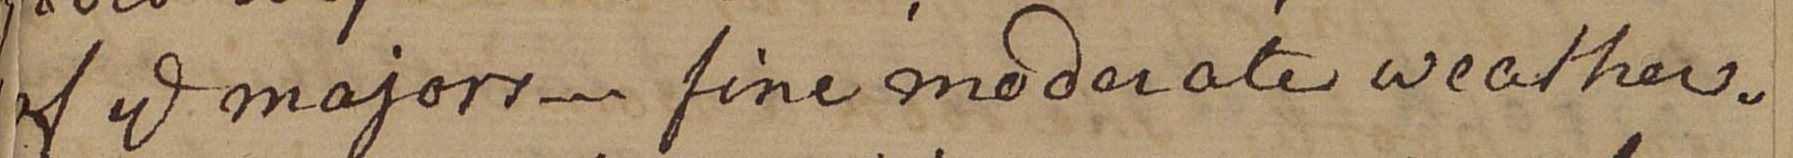of y^e majors- fine moderate weather.
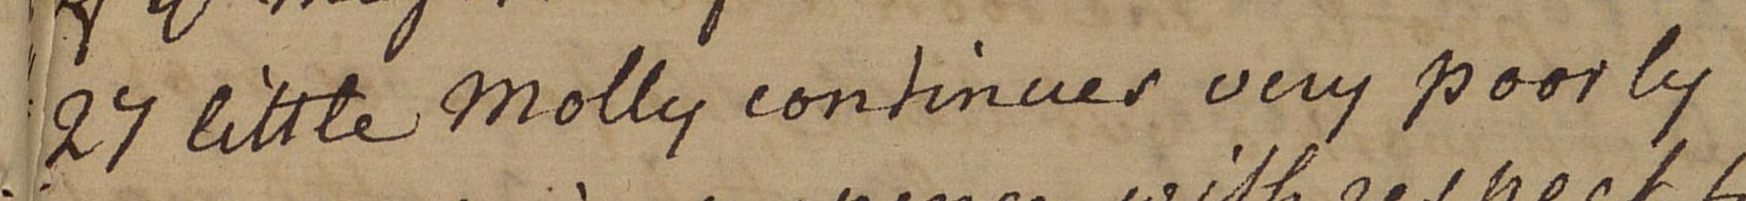27 little Molly continues very poorly
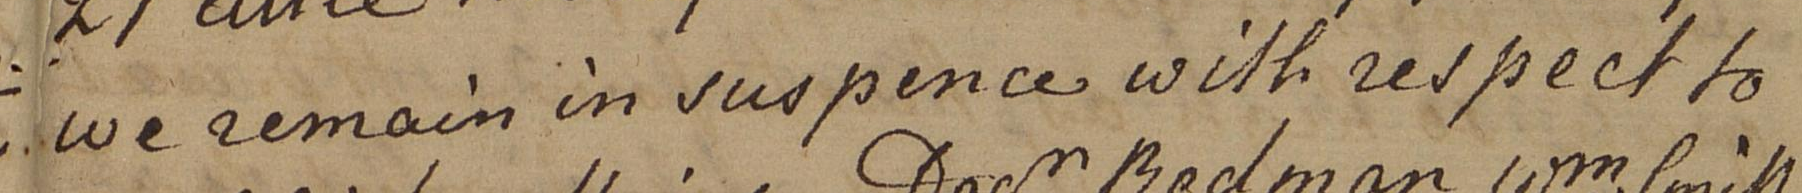we remain in suspence with respect to
